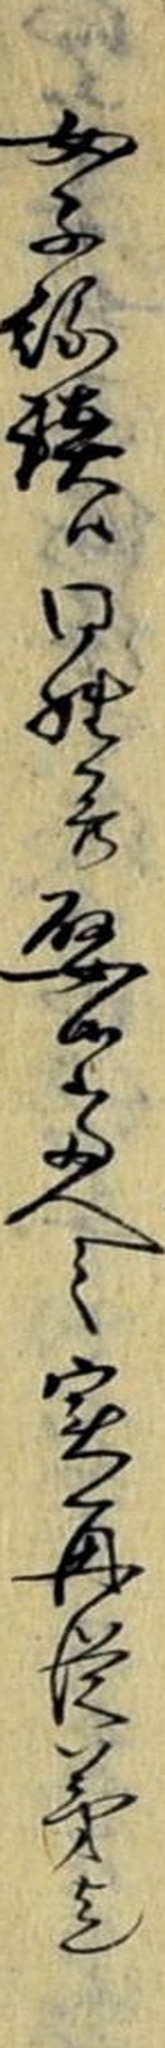女子縁談ハ同姓幷娶候当人之実再従弟迄
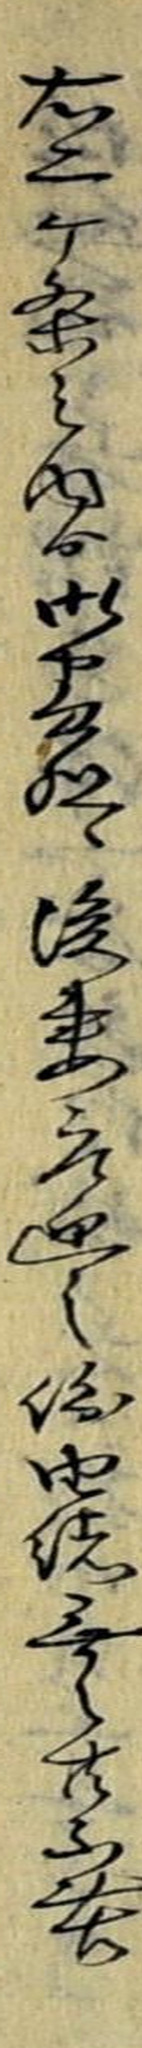右二ケ条之内ゟ御番組へ後妻取迎之儀由緒無之共不苦
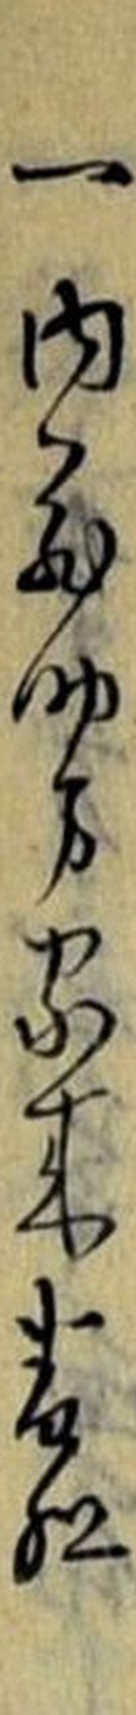一内蔵助方家来番組
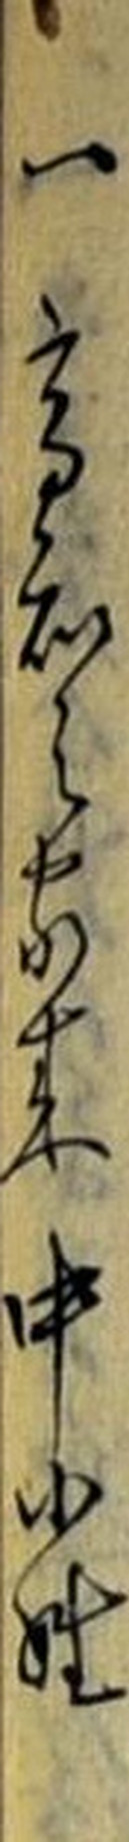一高知之家来中小姓
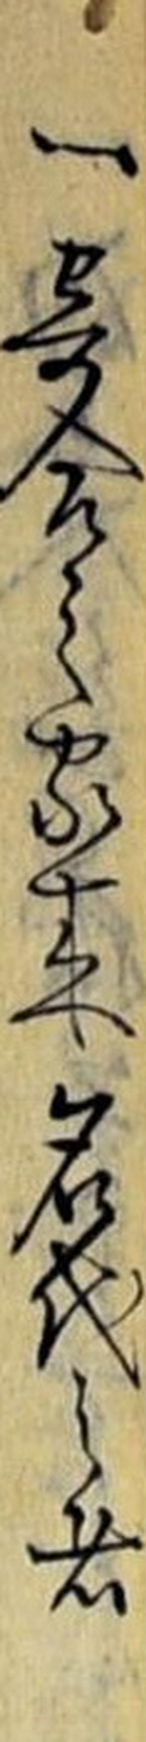一寄合之家来名代之者
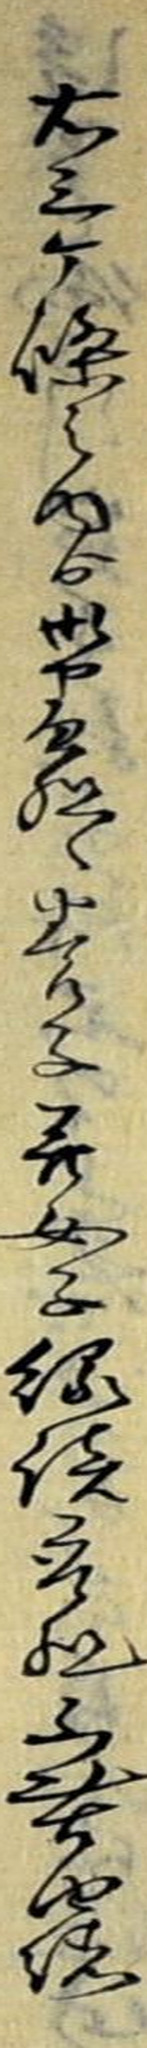右三ケ条之内ゟ御番組へ養子并女子縁談取組不苦由緒
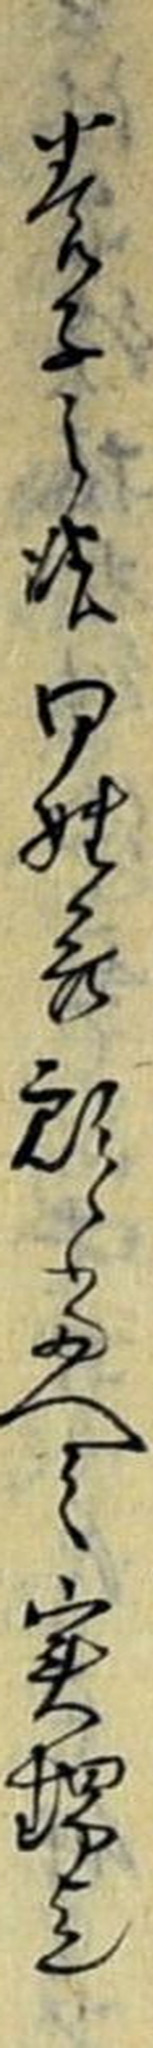養子之儀ハ同姓并願候当人之実甥迄
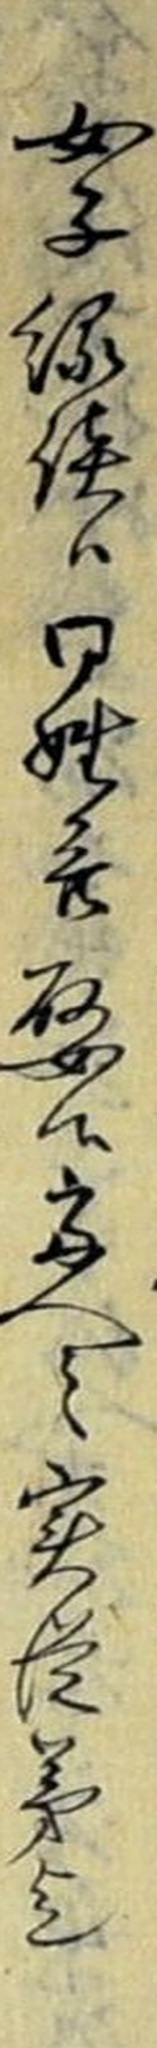女子縁談ハ同姓幷娶候当人之実再従弟迄
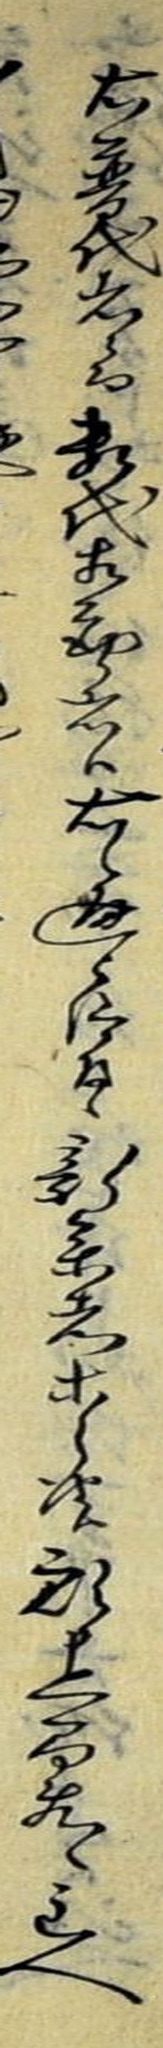右普代者ニ而数代相勤候者ハ右之通被仰付候新参者等之儀ハ願申上間敷候主人
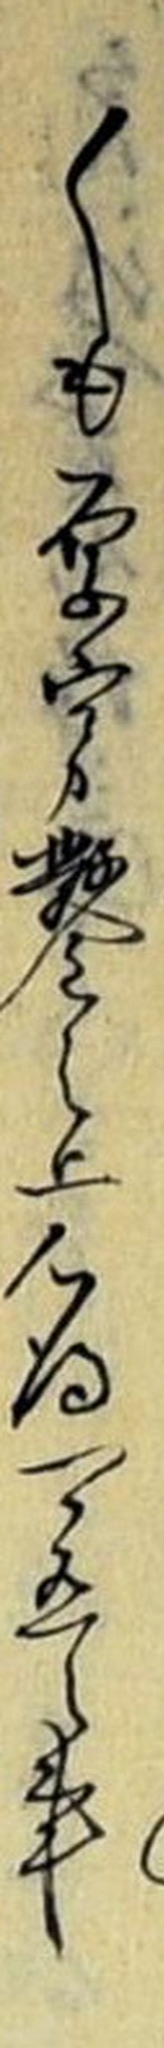〳〵も厚穿鑿之上心得可有之事
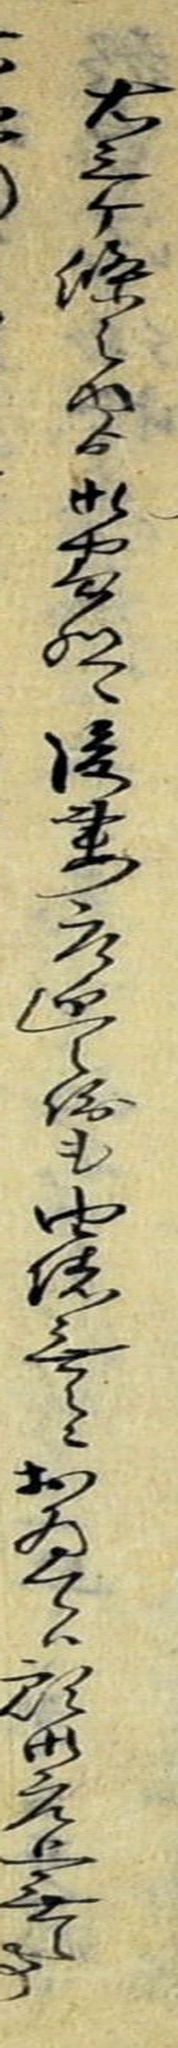右三ケ条之内ゟ御番組へ後妻取迎之儀も由緒無之ニおゐてハ願御取上無之事
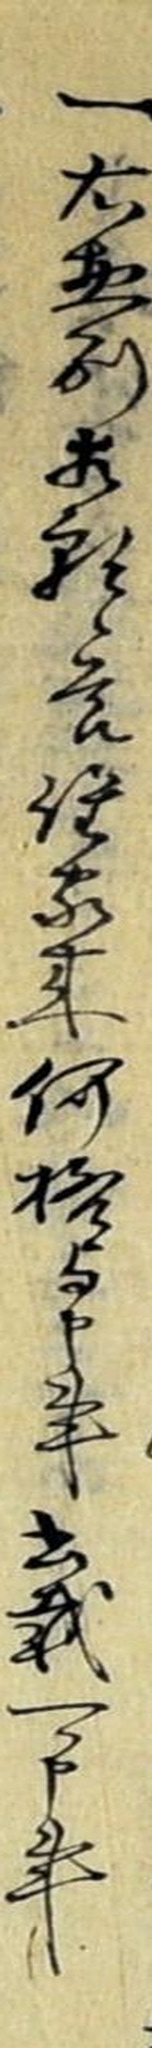一右惣別相願候節誰家来何格与申事書載可申事
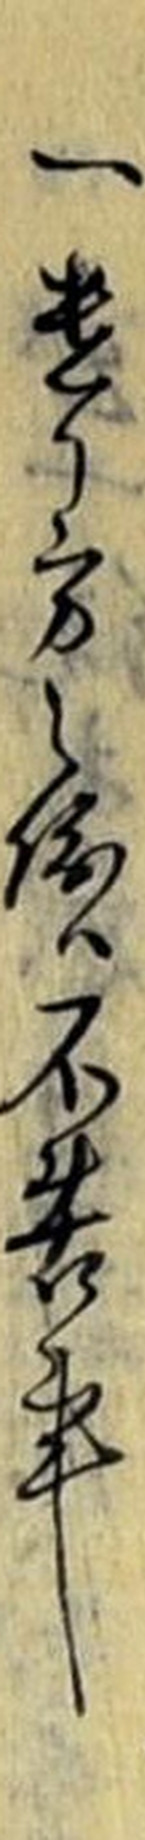一遣り方之儀ハ不苦事
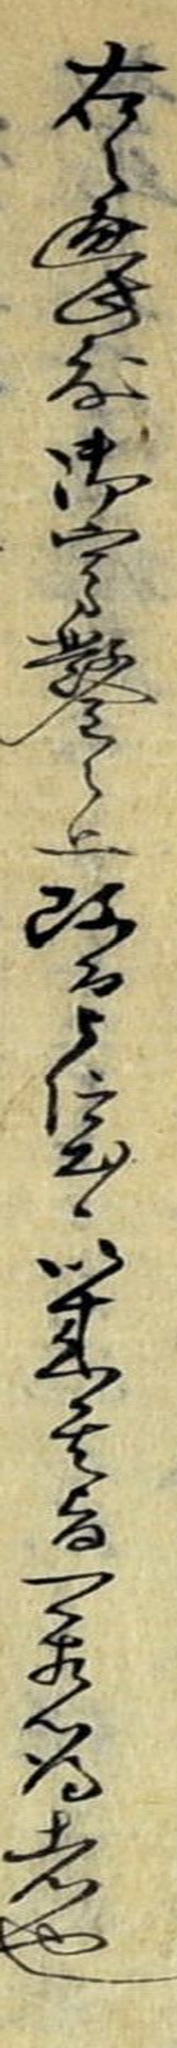右之通此度御穿鑿之上改而被仰出候以来其旨可相心得者也
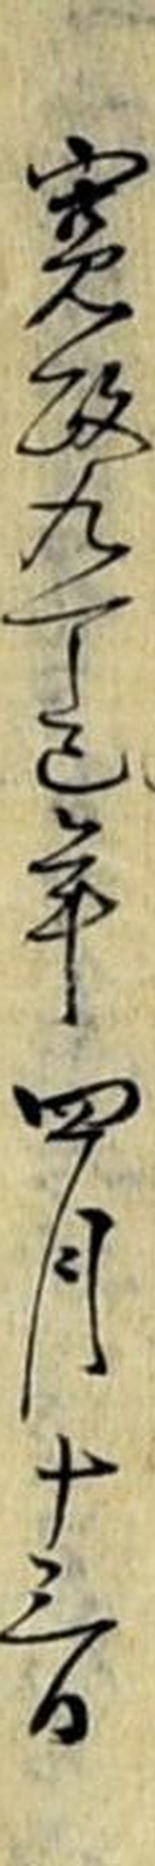寛政九丁巳年四月十三日
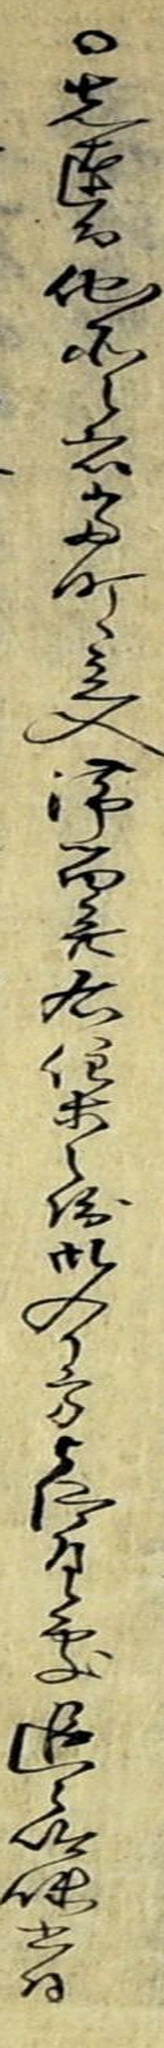〇先達而他所之者当町へ立入滞留并居住等之儀御〆り方被仰付候処追々吟味書付
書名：命令之部 三
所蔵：福井県文書館 Fukui Prefectural Archives
